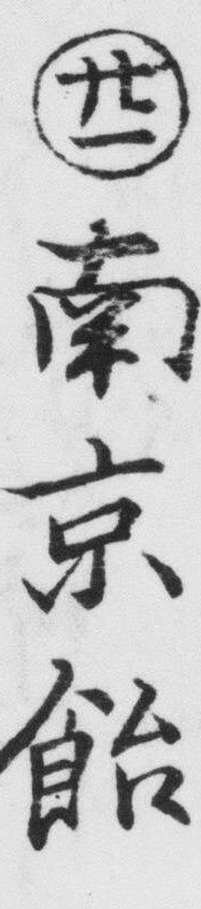(廿一)南京飴
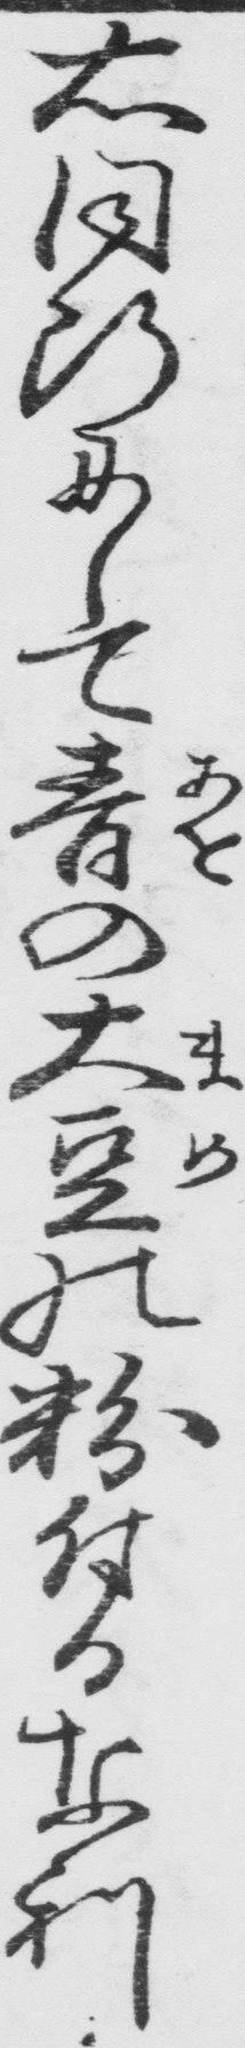右同断にして青の大豆の粉付るなり
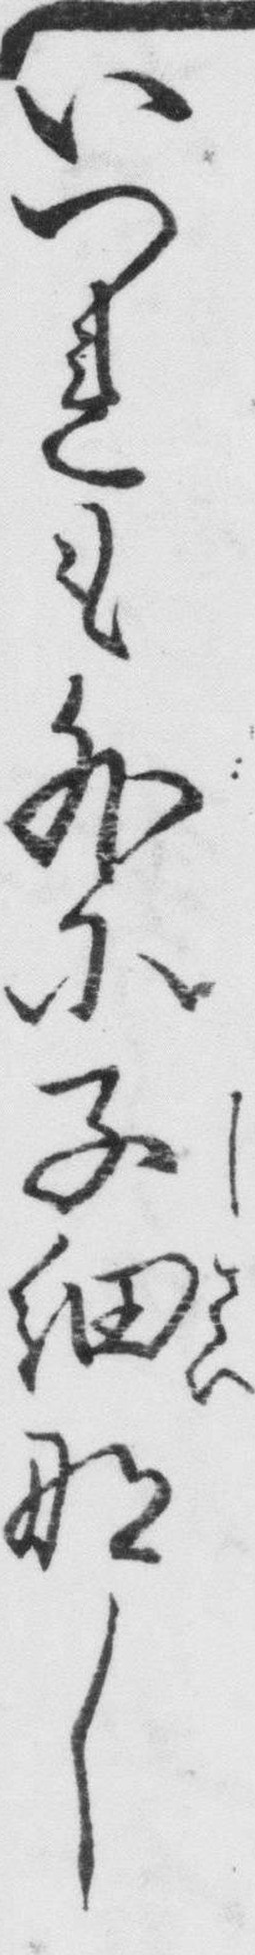いつれも外に子細なし
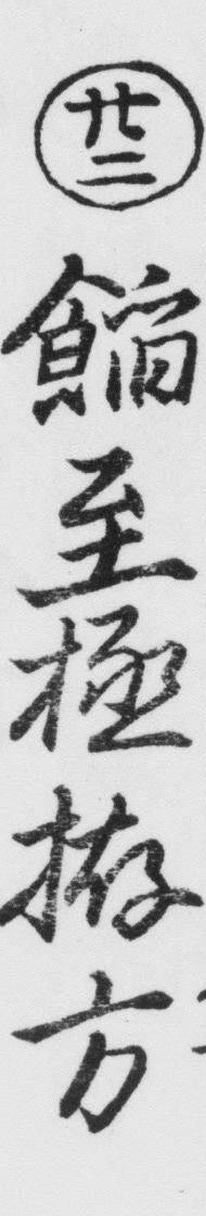(廿二)餡至極拵方
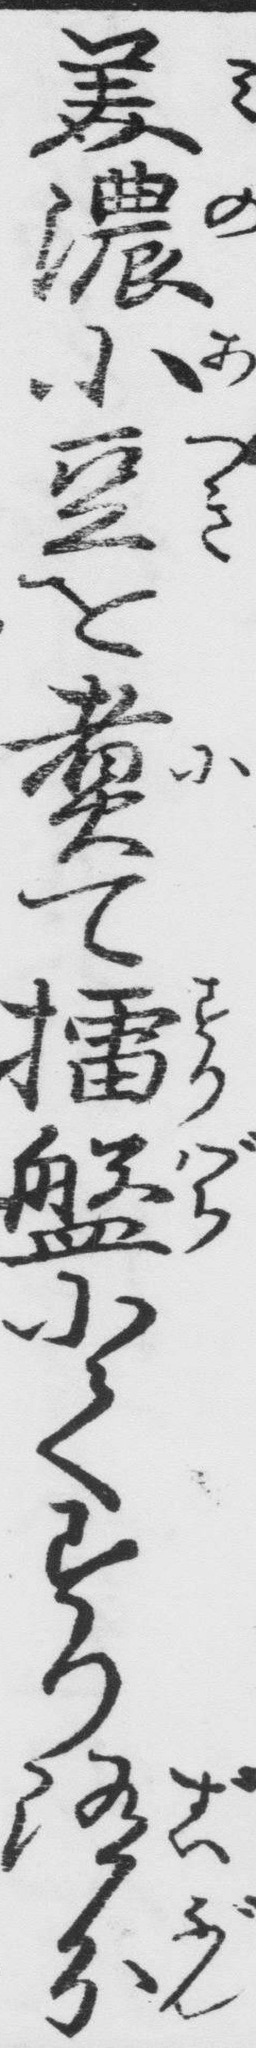美濃小豆を煮て擂盤にてすり随分
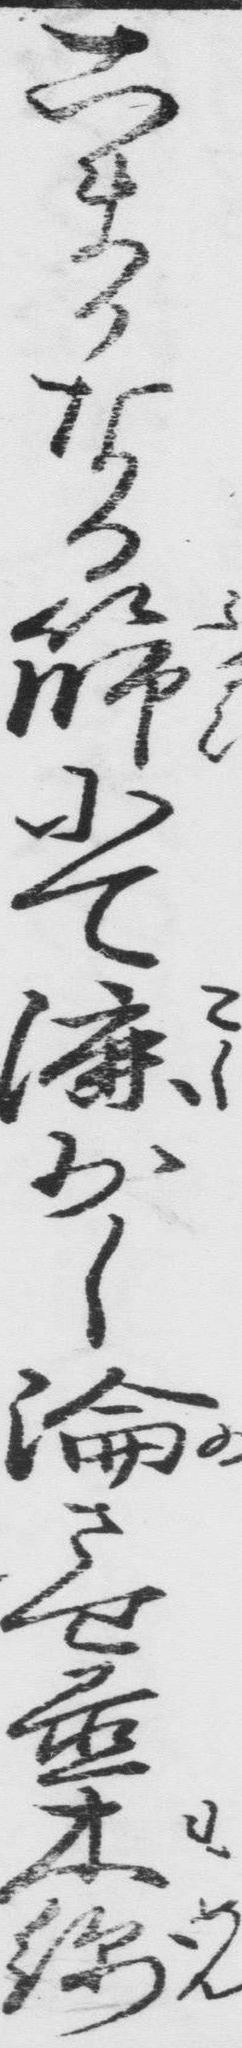こまかなる篩にて濾少し淪させ置木綿
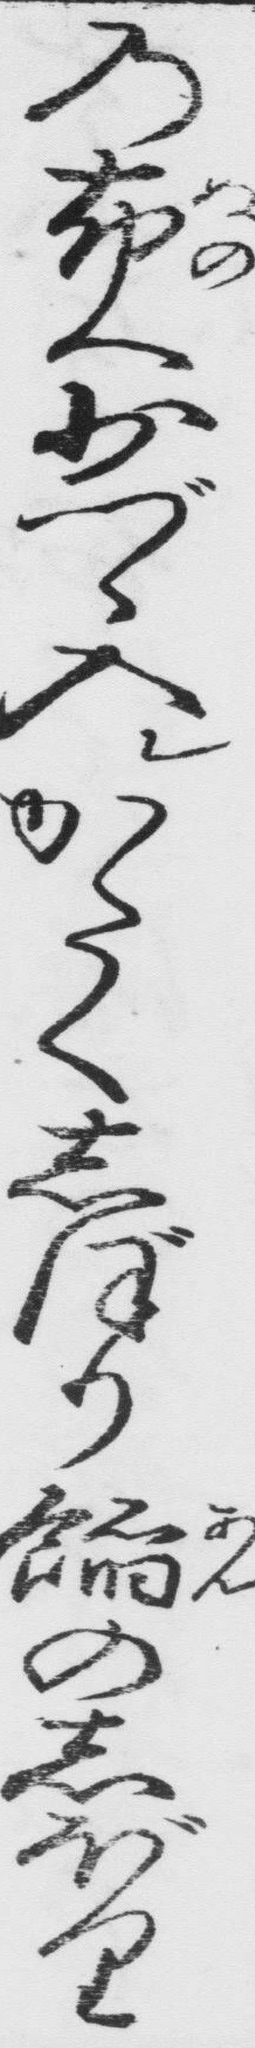の布へ少づゝ入れかたくしぼり餡のしぼり
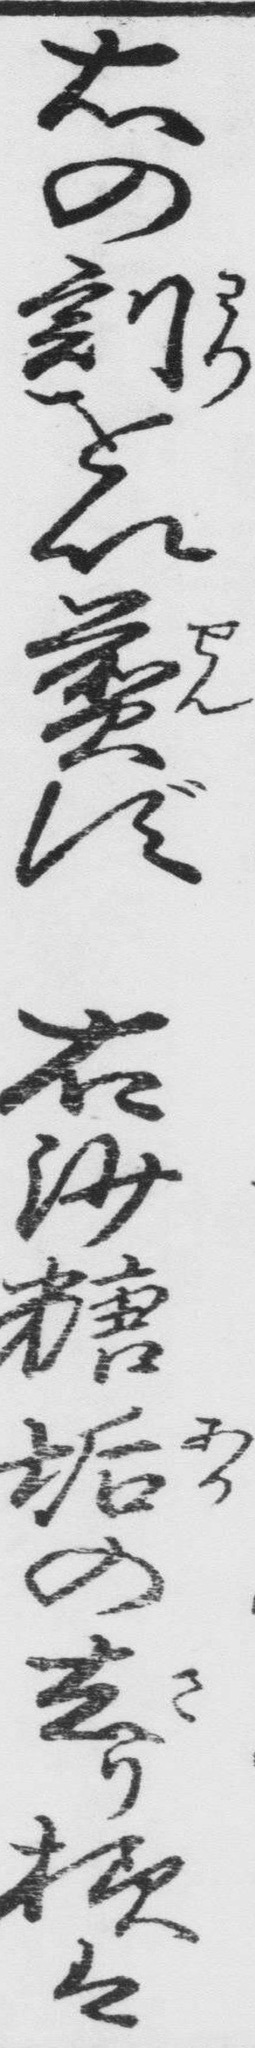右の割を以煎ず右沙糖垢の去り様は
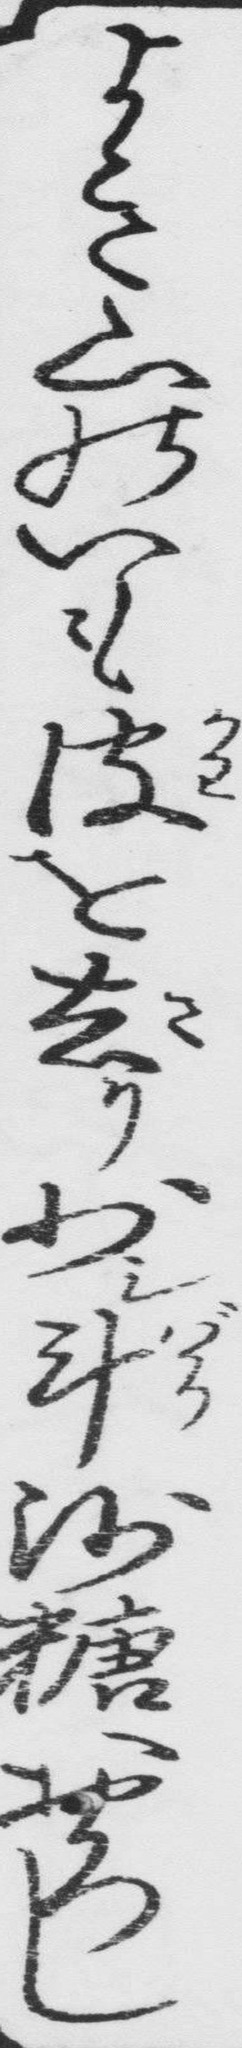よき山のいも皮を去り少し斗沙糖へおろし

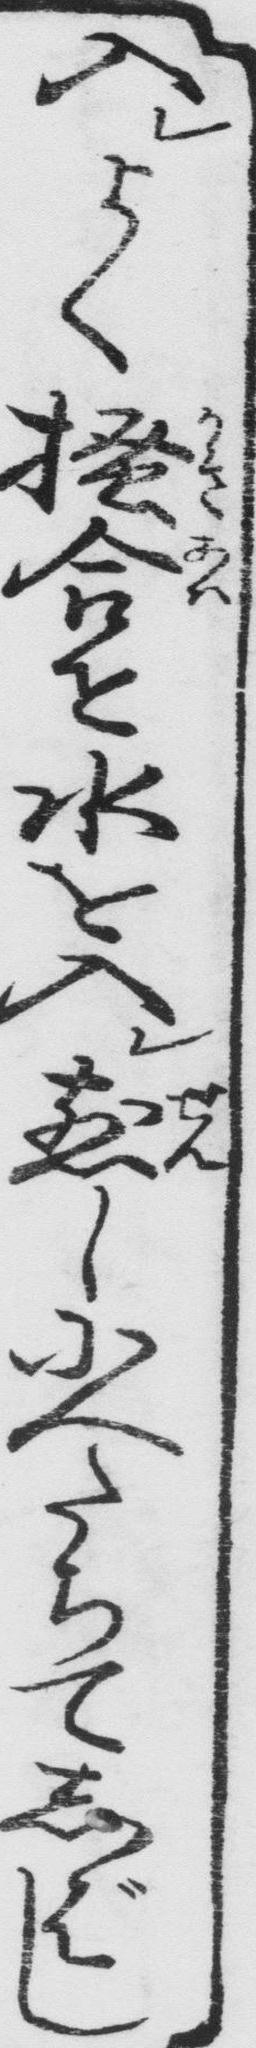入れよく掻合せ水を入れ煎しにへたちてしばし
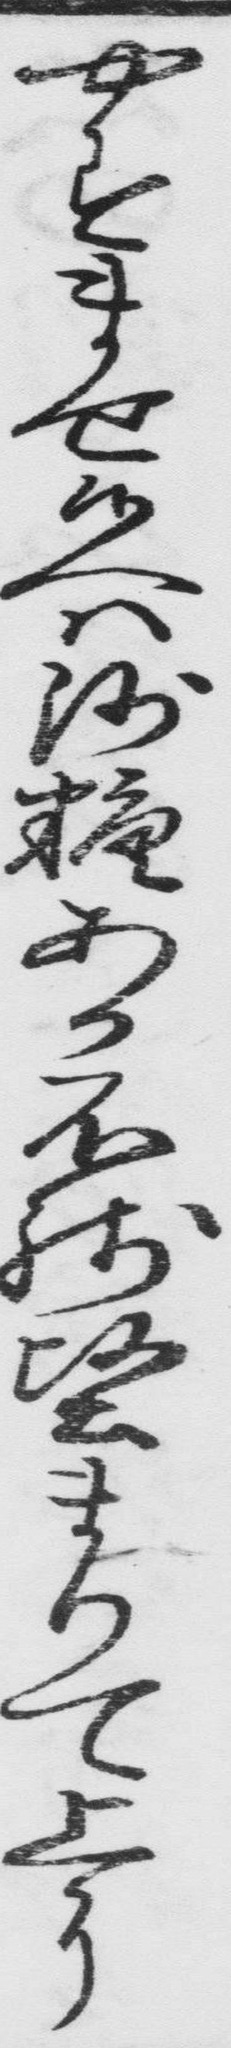やすませ候へは沙糖あか不残堅まりて上に
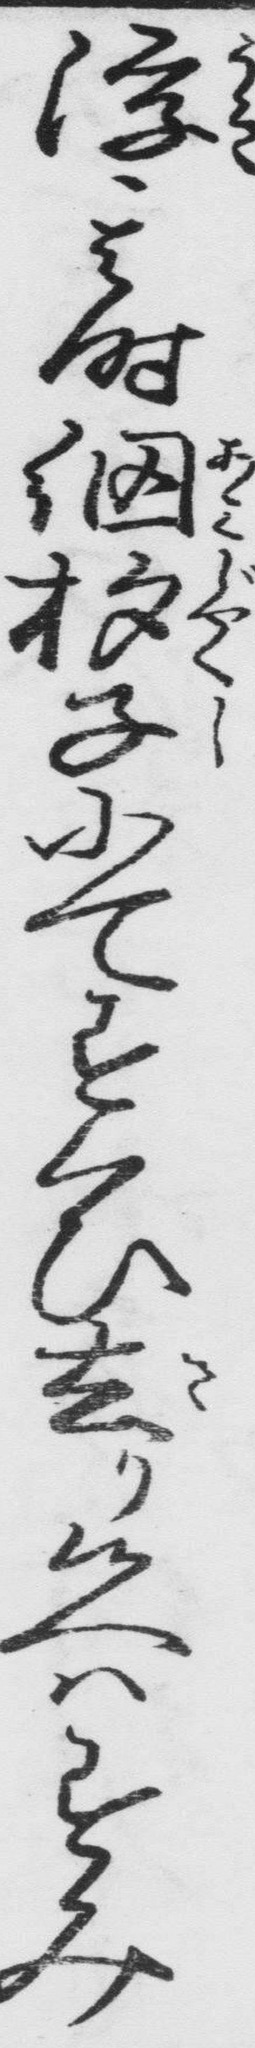浮其時網杓子にてすくひ去り候へはすみ
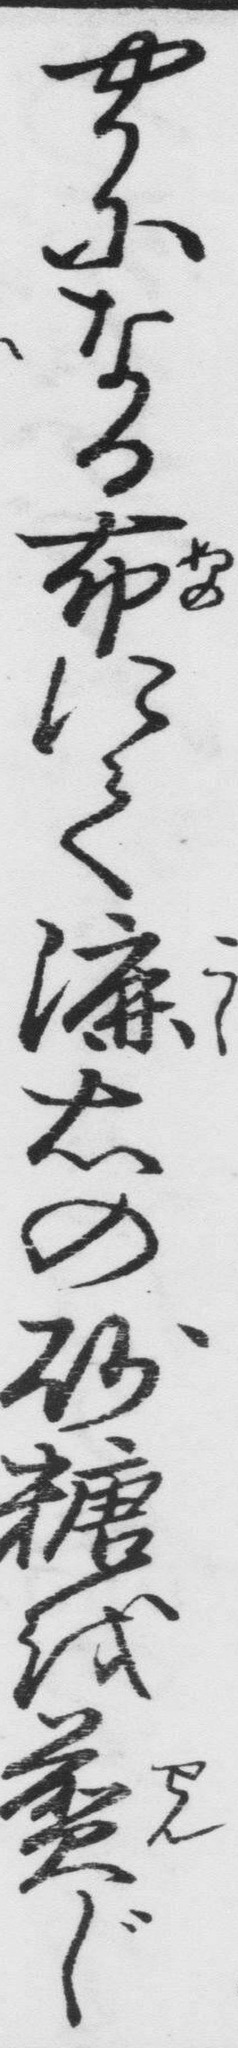やかになる布にて漉右の砂糖を煎じ
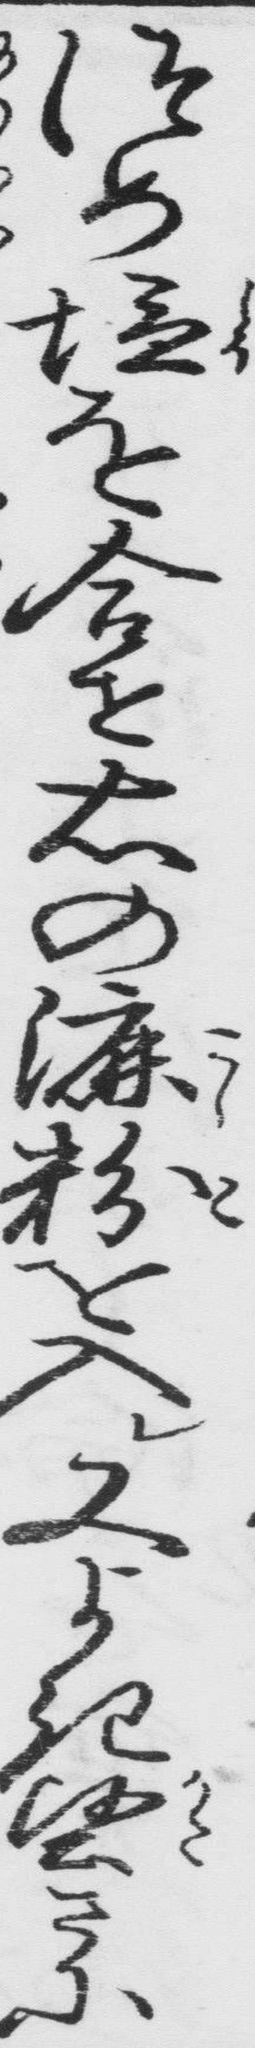つめ塩を合せ右の漉粉を入れ又よき堅さに
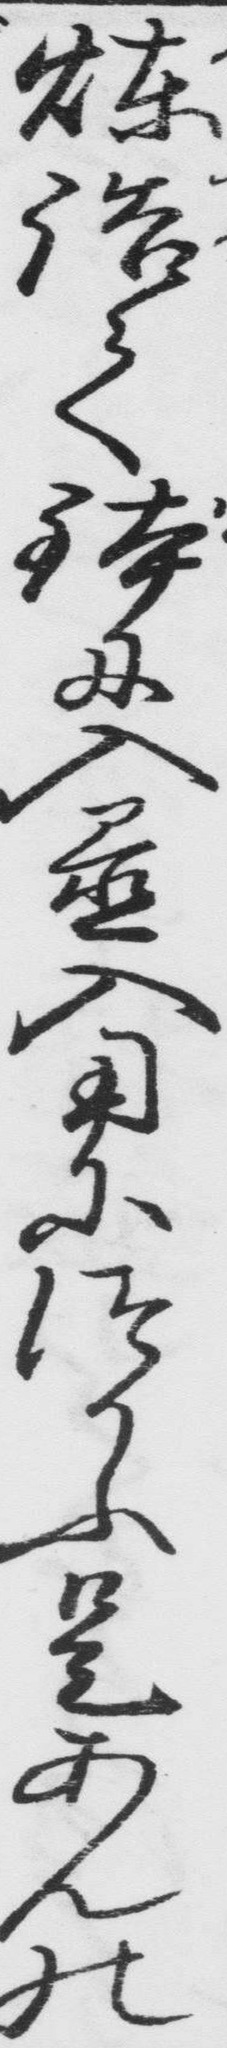煉詰て鉢に入置入用につかふ是あんの
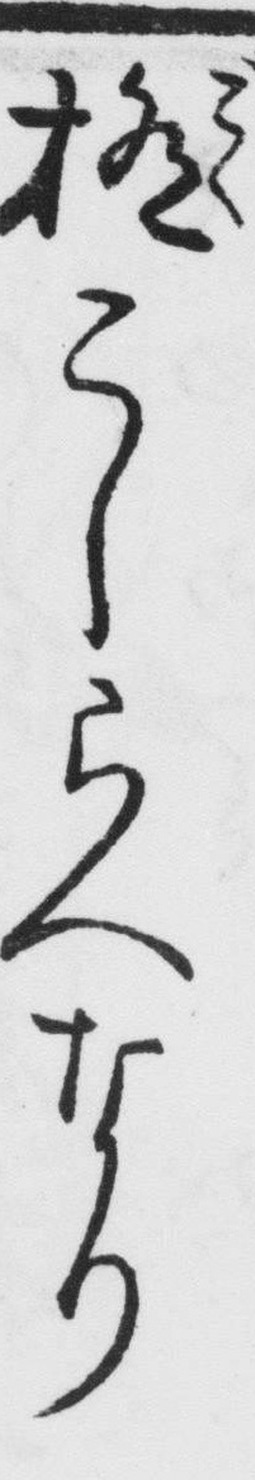極こしらへなり
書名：御前菓子図式
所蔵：大阪府立大学学術情報センター 国文学研究資料館
